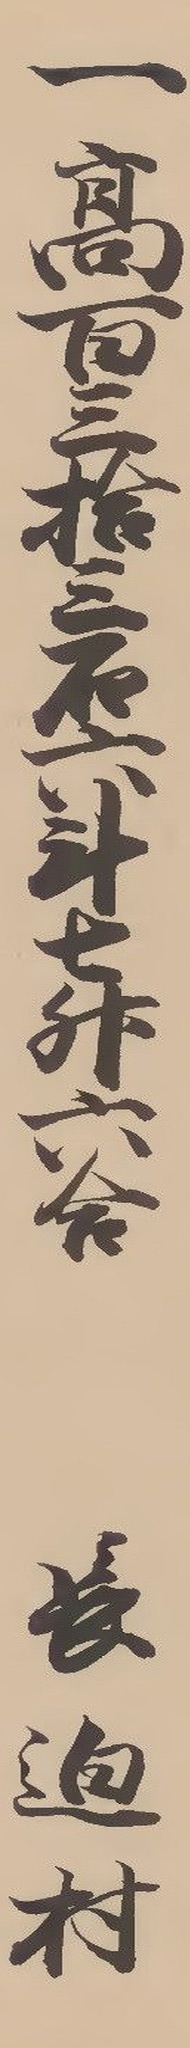一高百三拾三石六斗七升六合長迫村
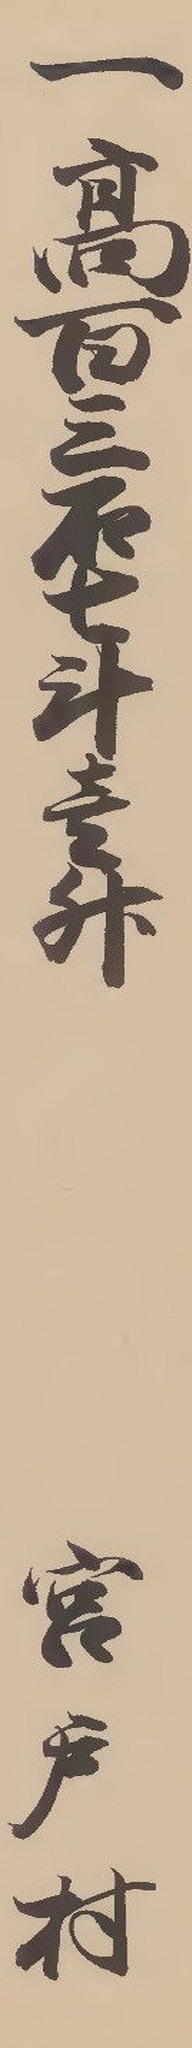一高百三石七斗壱升宮戸村
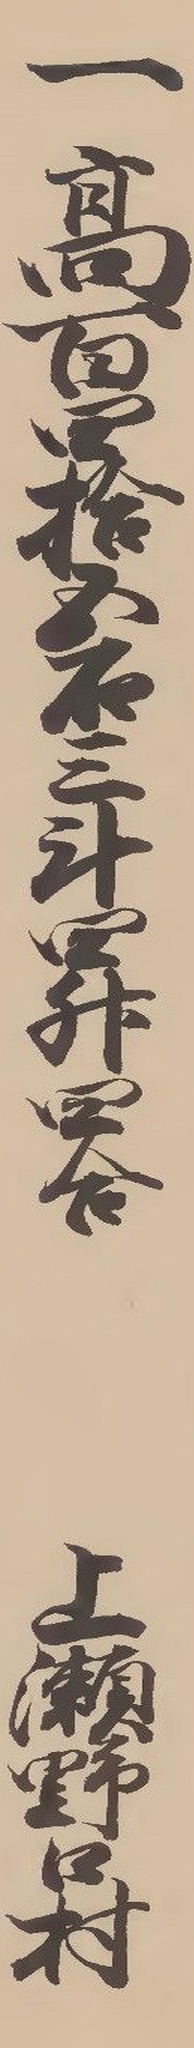一高百四拾五石三斗四升四合上瀬野口村
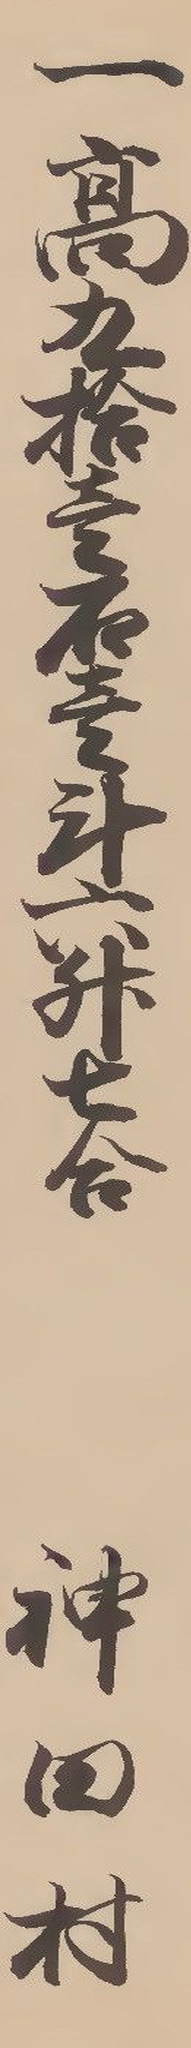一高九拾壱石壱斗六升七合神田村
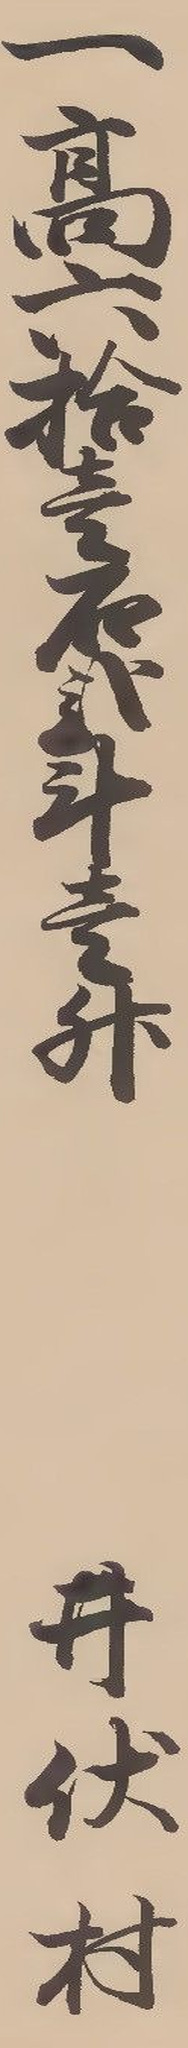一高六拾壱石弐斗壱升井伏村
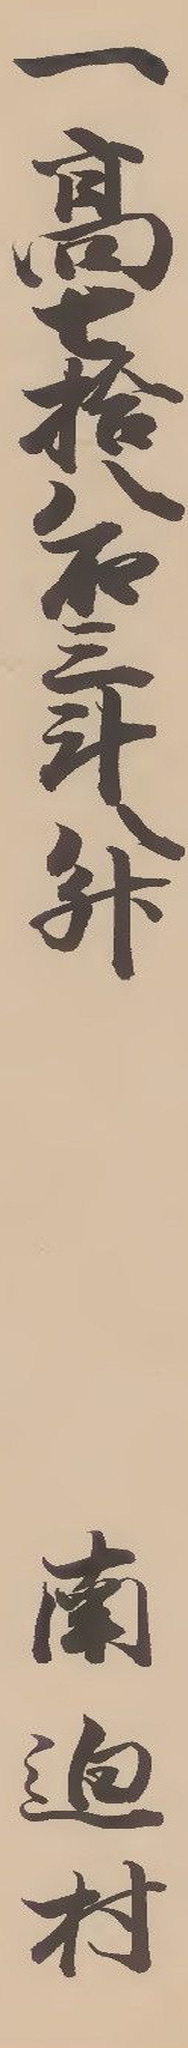一高七拾八石三斗八升南迫村
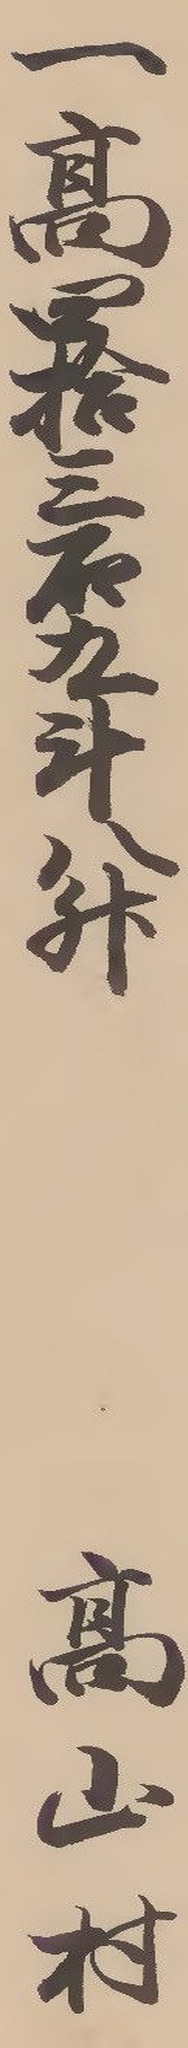一高四拾三石九斗八升高山村

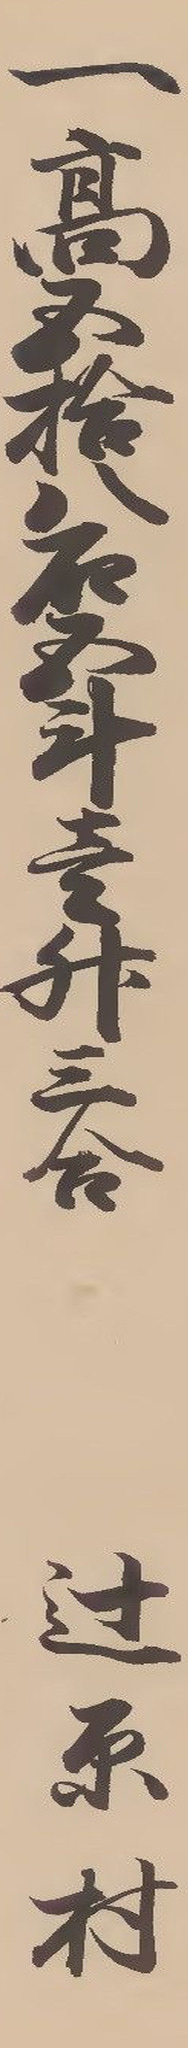一高五拾八石五斗壱升三合辻原村
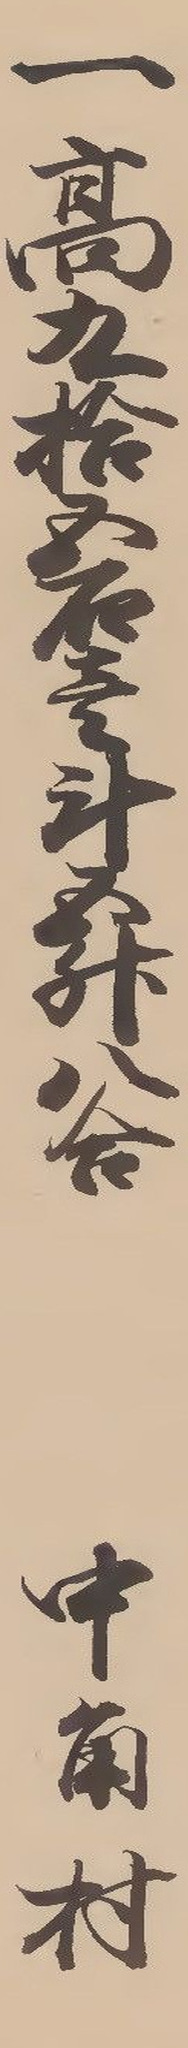一高九拾五石壱斗五升八合中角村
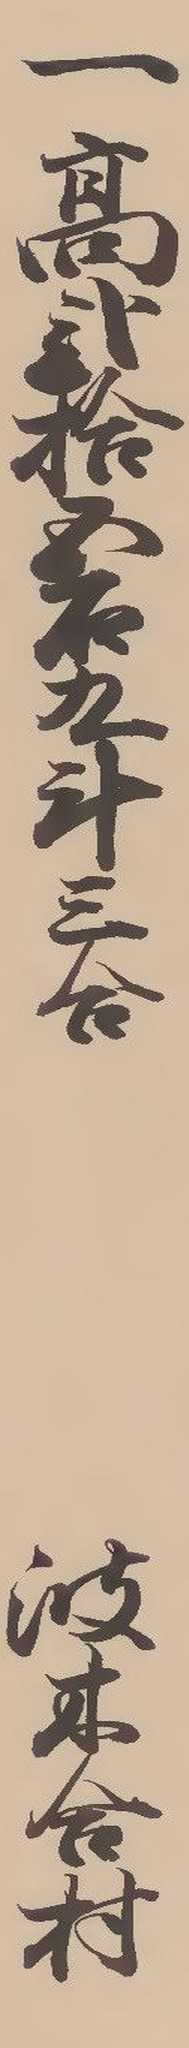一高弐拾五石九斗三合波木合村
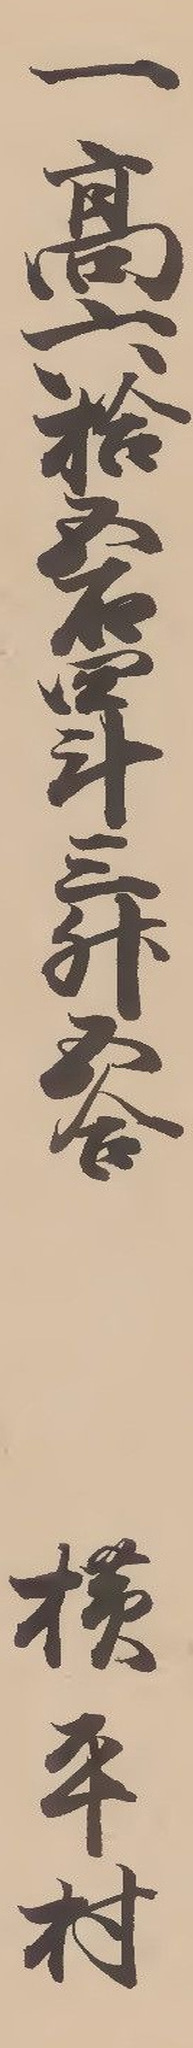一高六拾五石四斗三升五合横平村
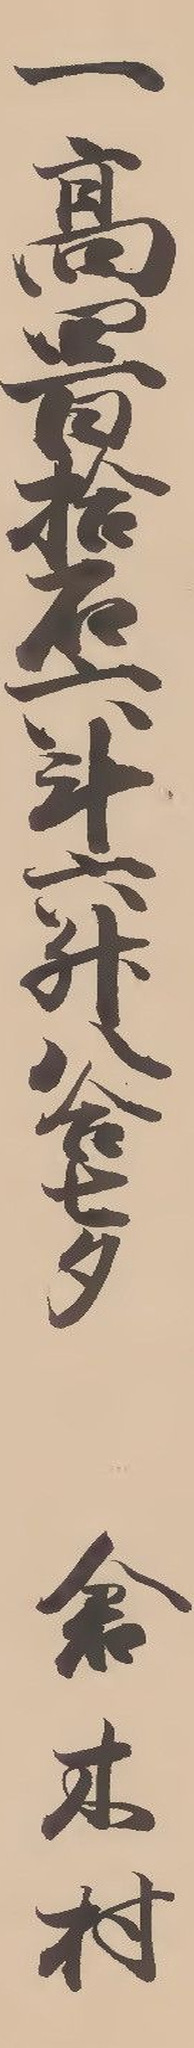一高四百拾石六斗六升八合七勺倉木村
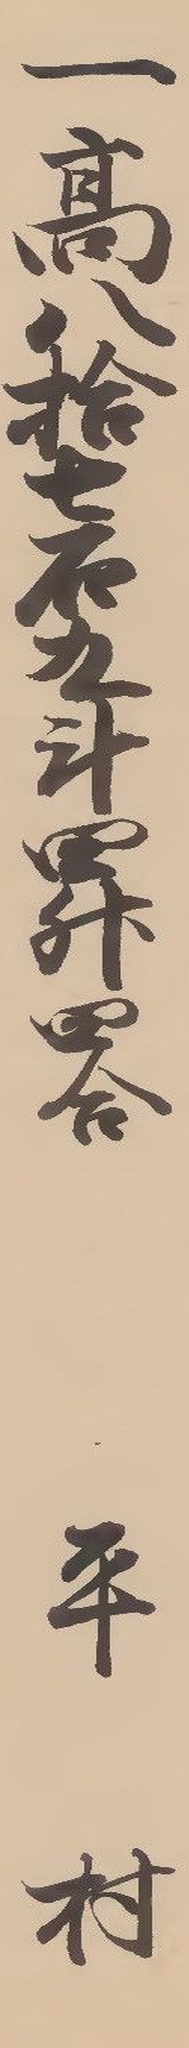一高八拾七石九斗四升四合平村
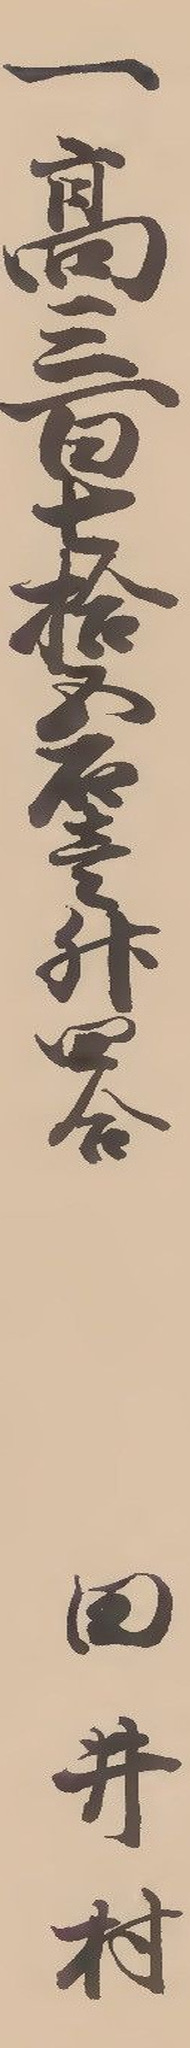一高三百七拾五石壱升四合田井村
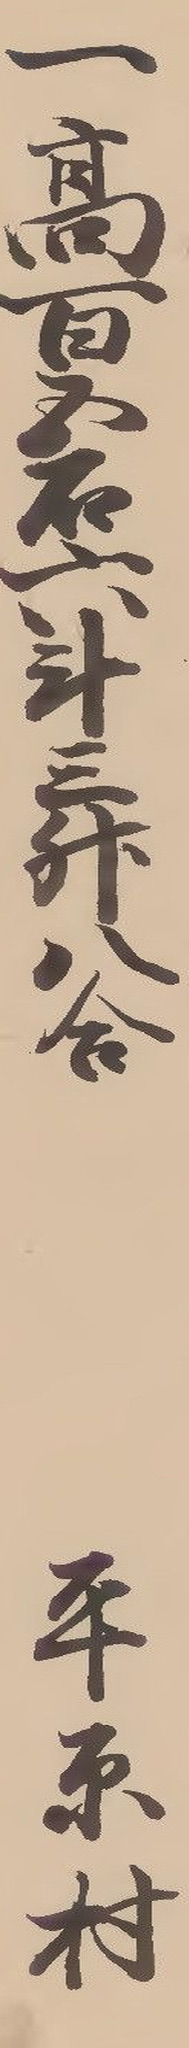一高百五石六斗三升八合平原村

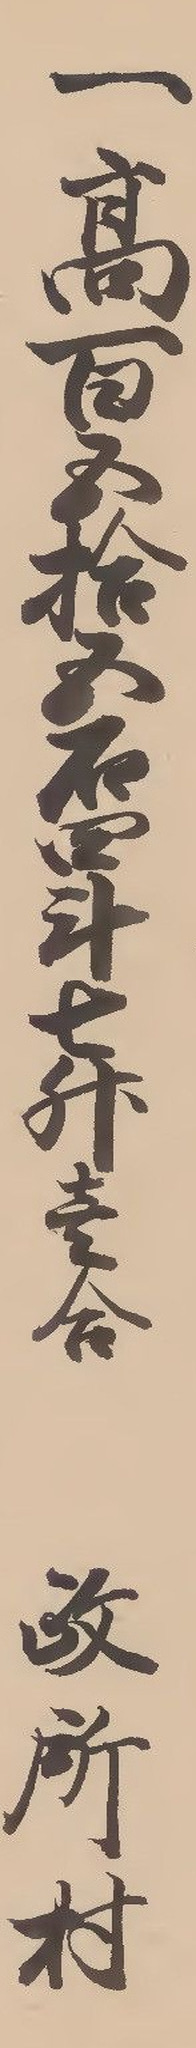一高百五拾五石四斗七升壱合政所村
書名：豊後国郷帳
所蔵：国立公文書館 National Archives of Japan
